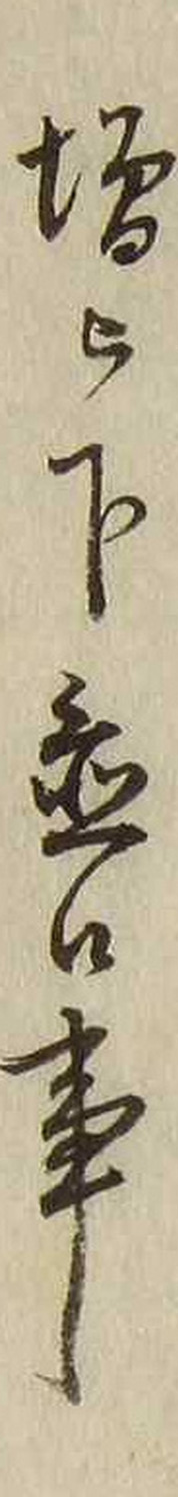増被下置候事
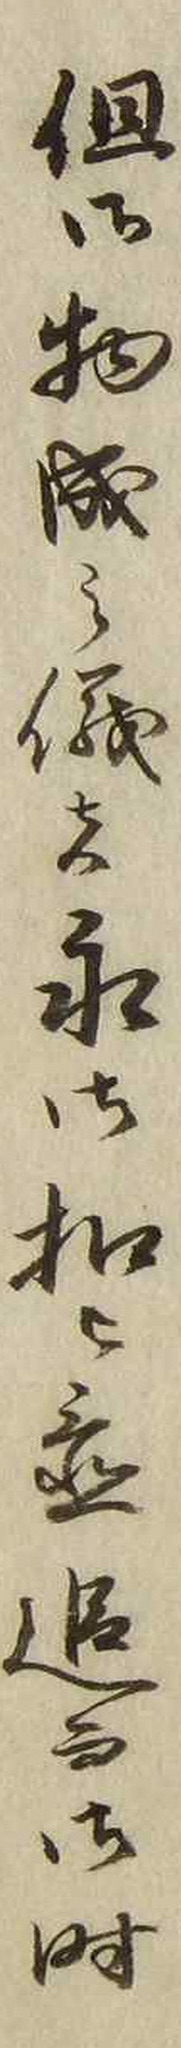但御物成之儀は永御扣置追而御時

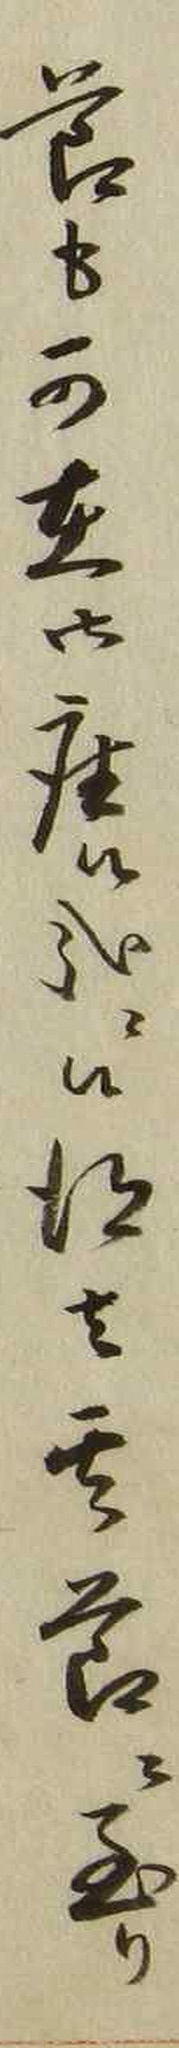節も可在御座候哉に候得は其節に至り
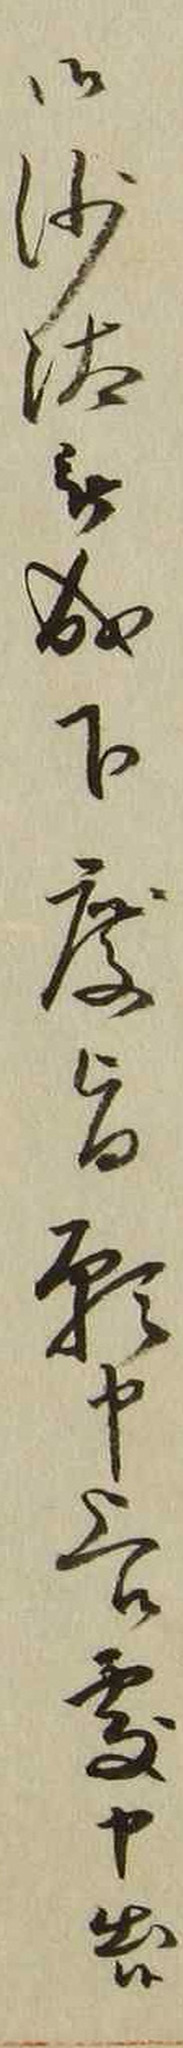御沙汰被成下度旨願申上候処申出候
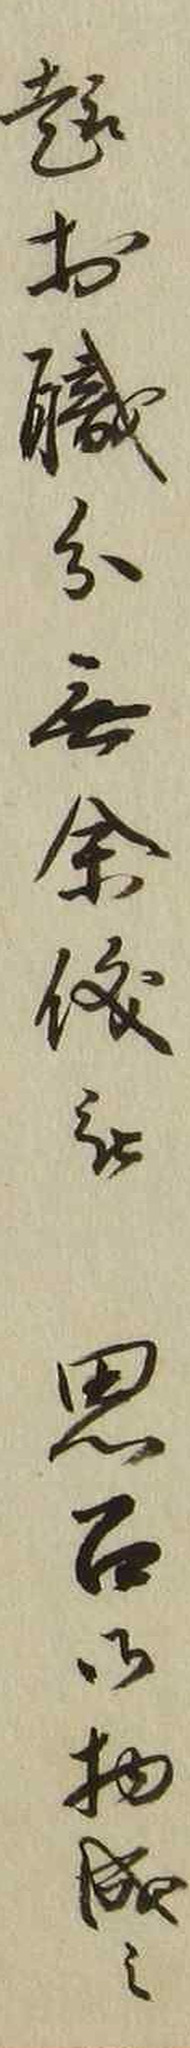趣於職分無余儀被思召御物成之
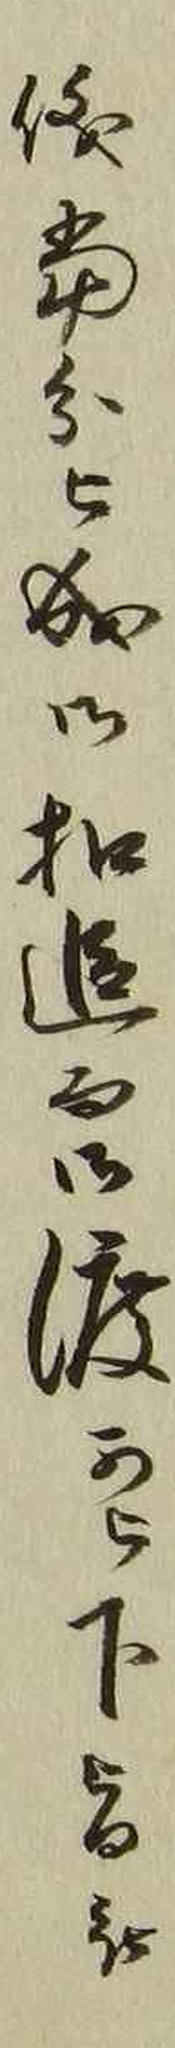儀当分被成御扣追而御渡可被下旨被
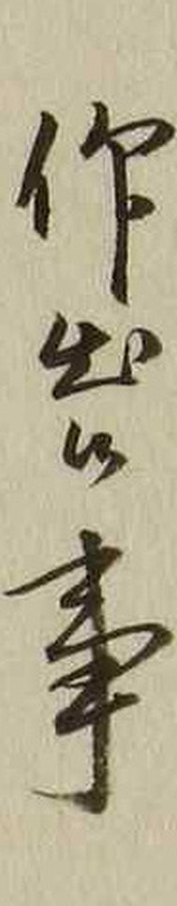仰出候事
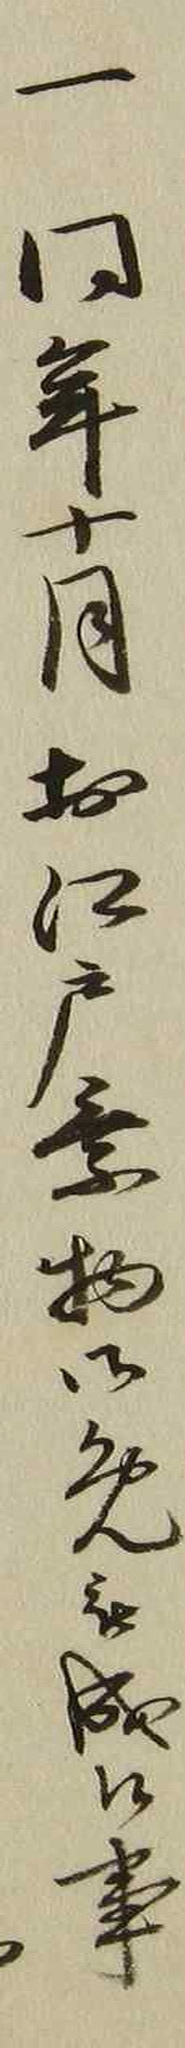一同年十月於江戸乗物御免被成候事
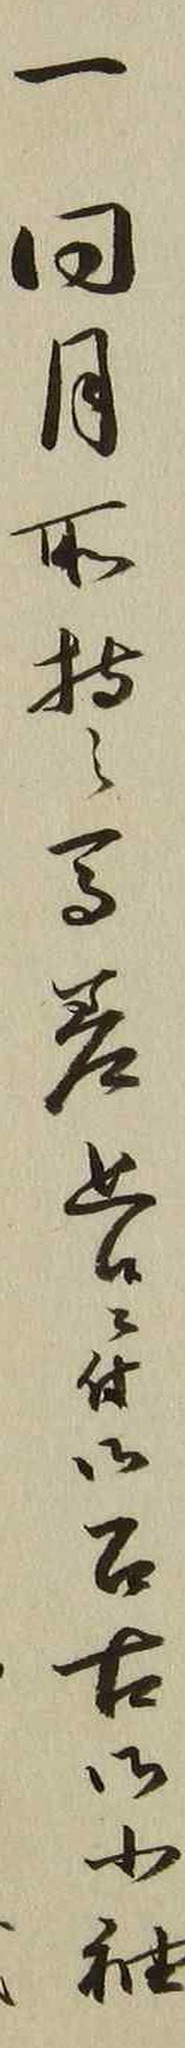一同月所持之馬差上候に付御召古御小袖
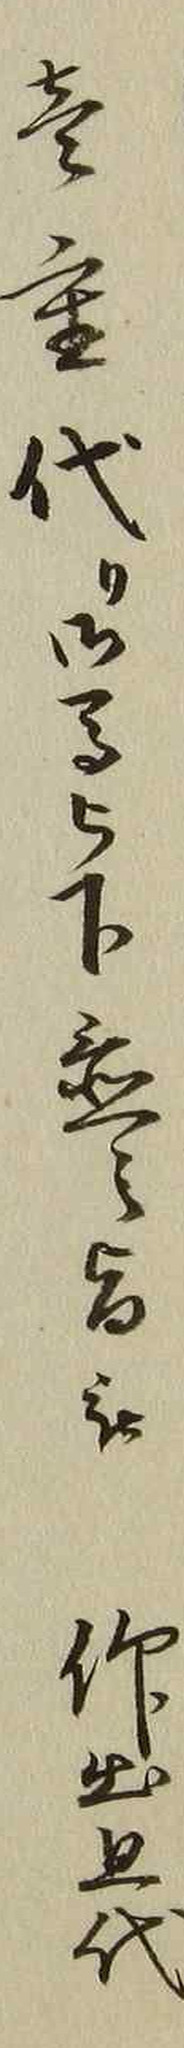壱重代り御馬被下置之旨被仰出且代
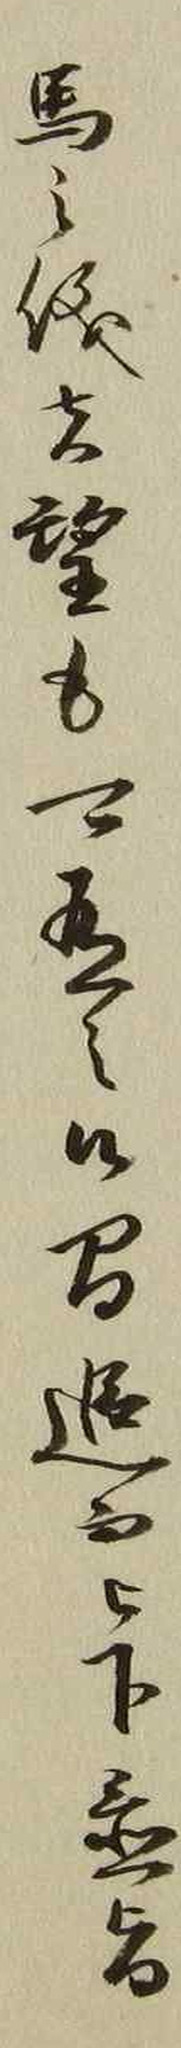馬之儀は望も可有之候間追而被下置旨
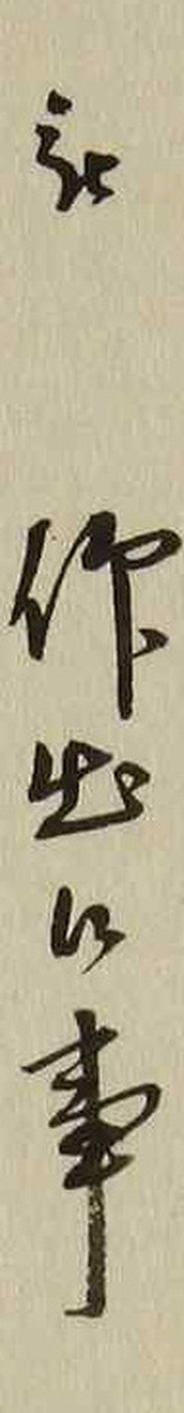被仰出候事
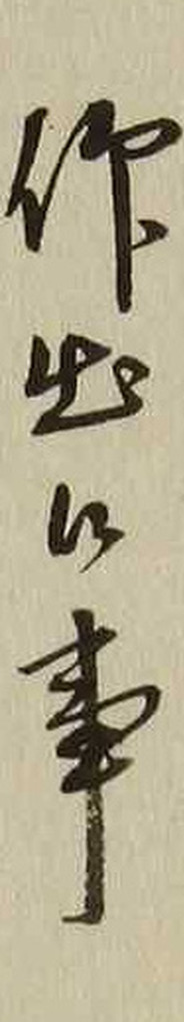仰出候事
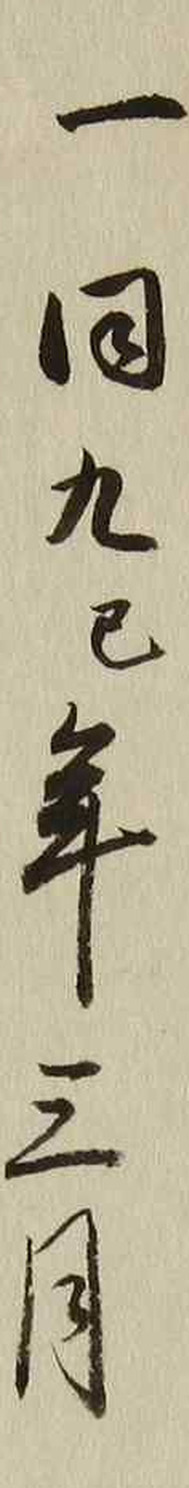一同九巳年九月
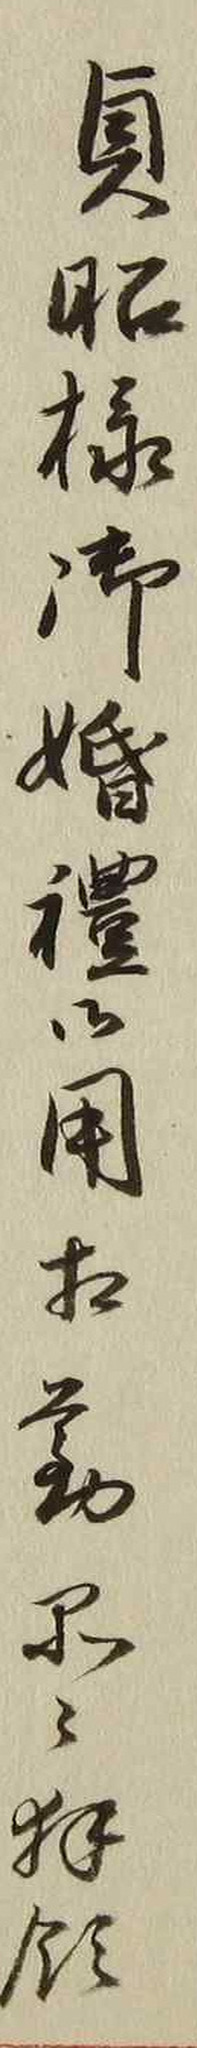貞昭様御婚礼御用相勤品々拝領
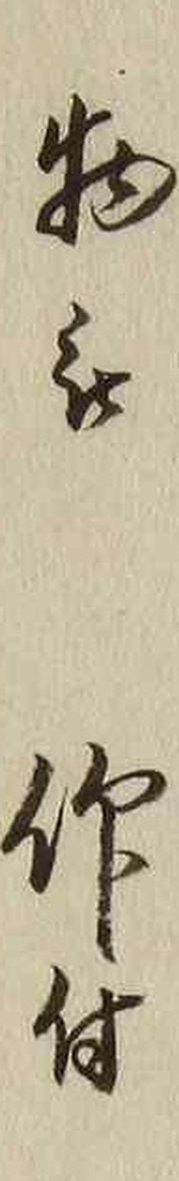物被仰付
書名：諸士系譜　巻之125　た之部1
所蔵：会津若松市立会津図書館
